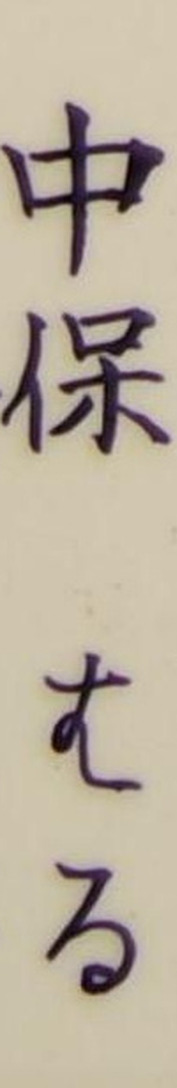中保はる
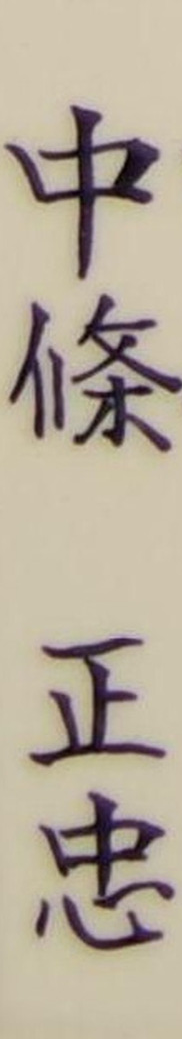中條正忠

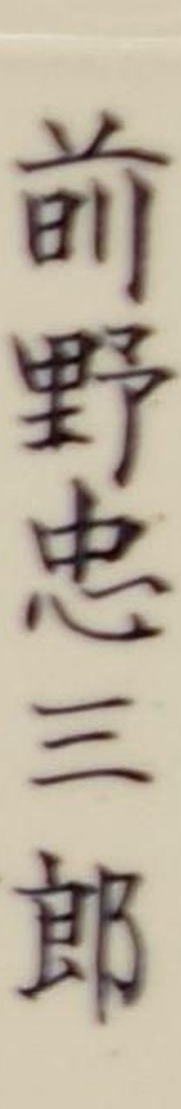前野忠三郎
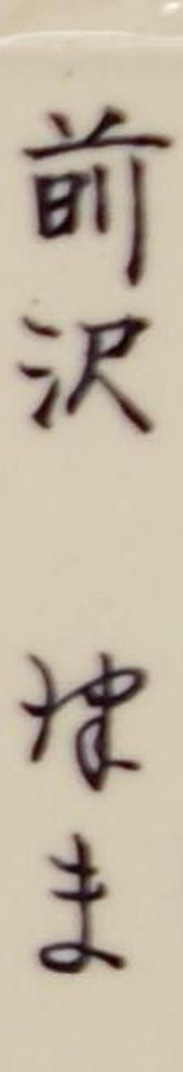前沢つま
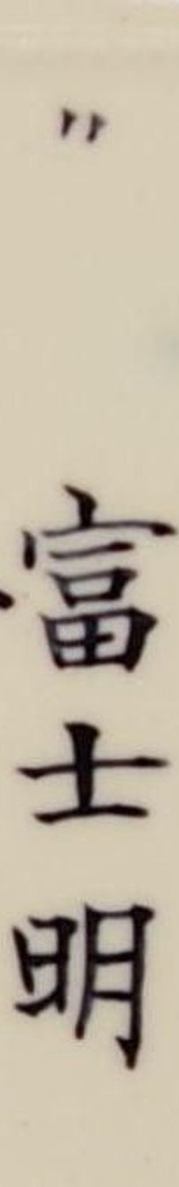富士明
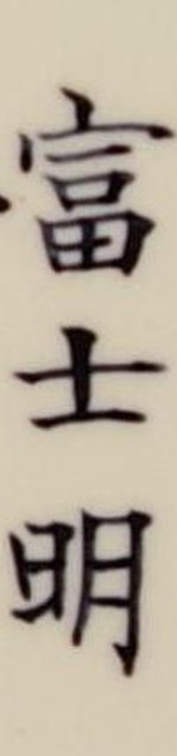富士明
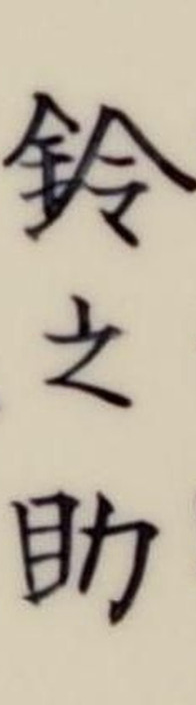鈴之助
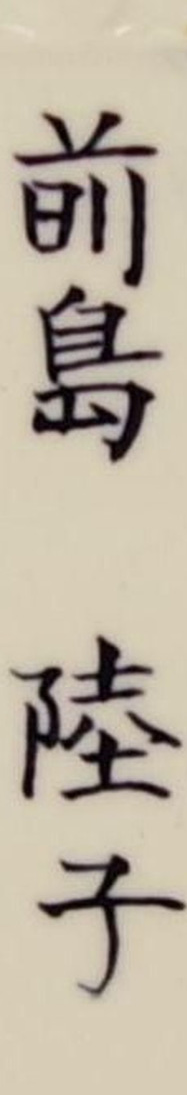前島陸子
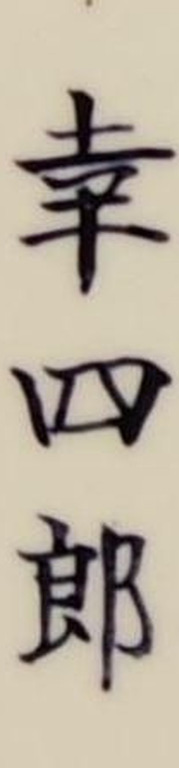幸四郎
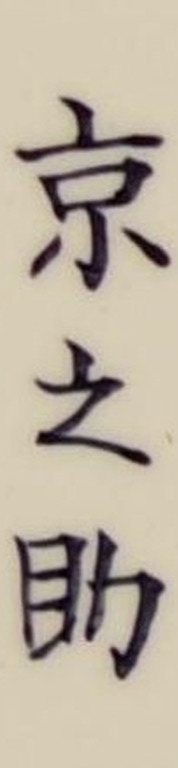京之助
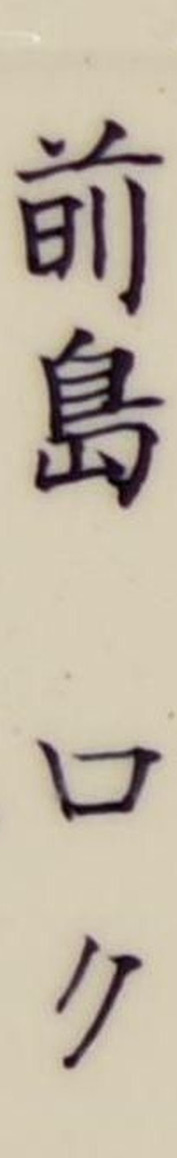前島ロク
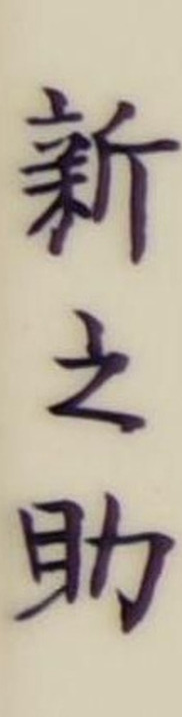新之助

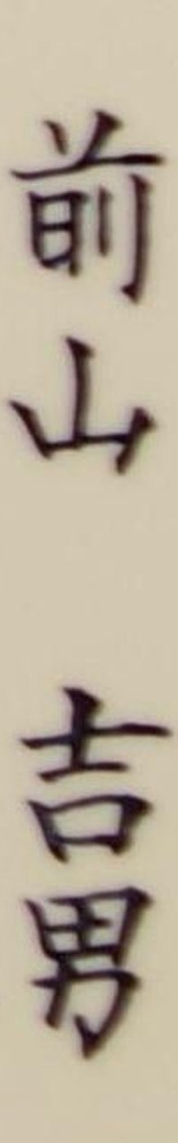前山吉男
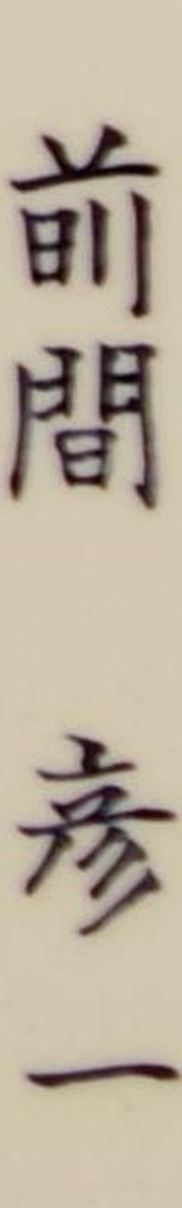前間彦一
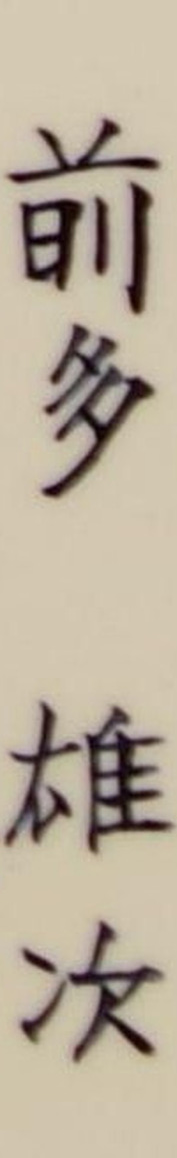前多雄次
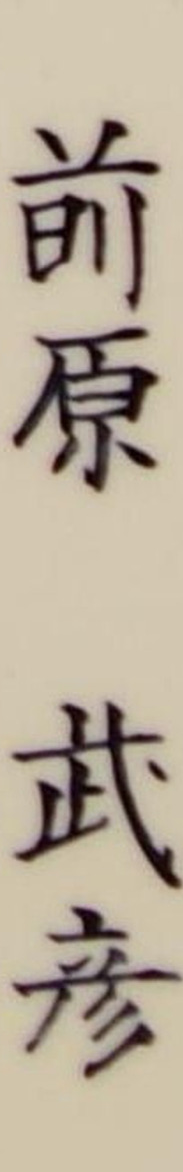前原武彦
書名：A~D
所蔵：koyasan kongobuji
